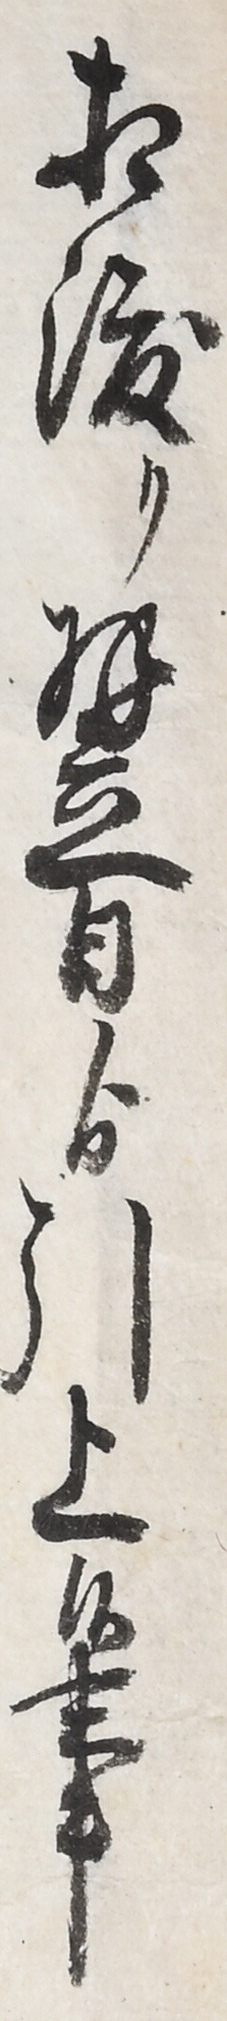相渡り翌日ゟ引上候事
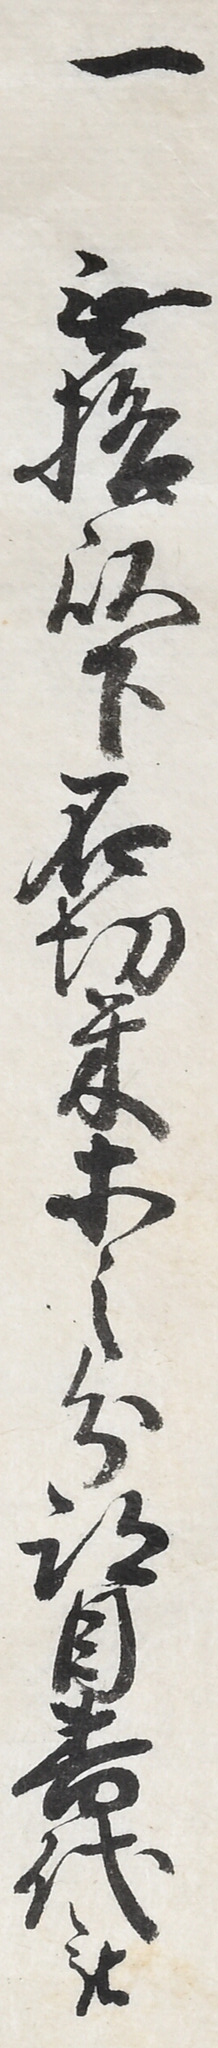一無格以下石切米等之分跡目番代被
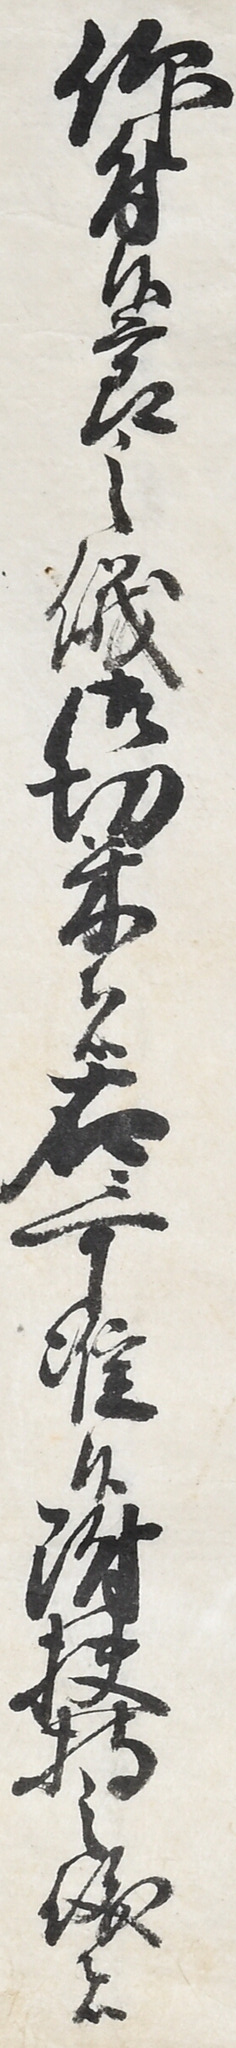仰付候節之儀御切米は右ニ可准候附扶持之儀は
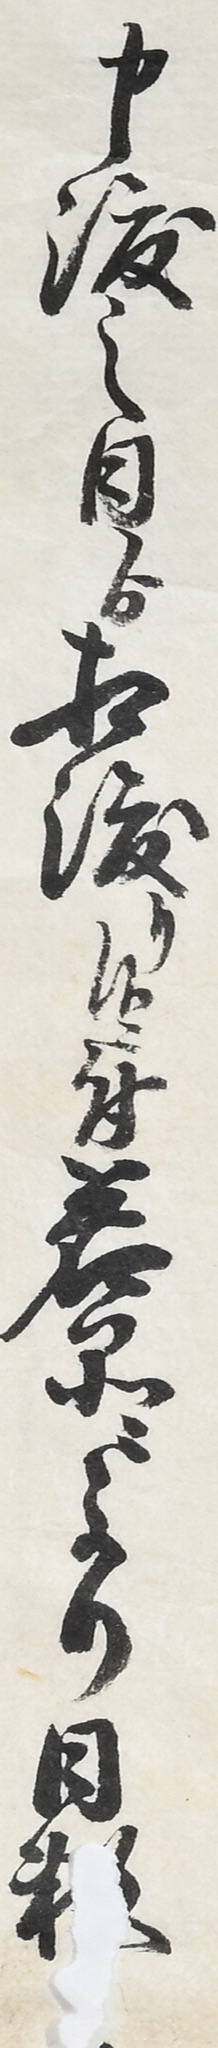申渡之月ゟ相渡り候ニ付若品ニより月数
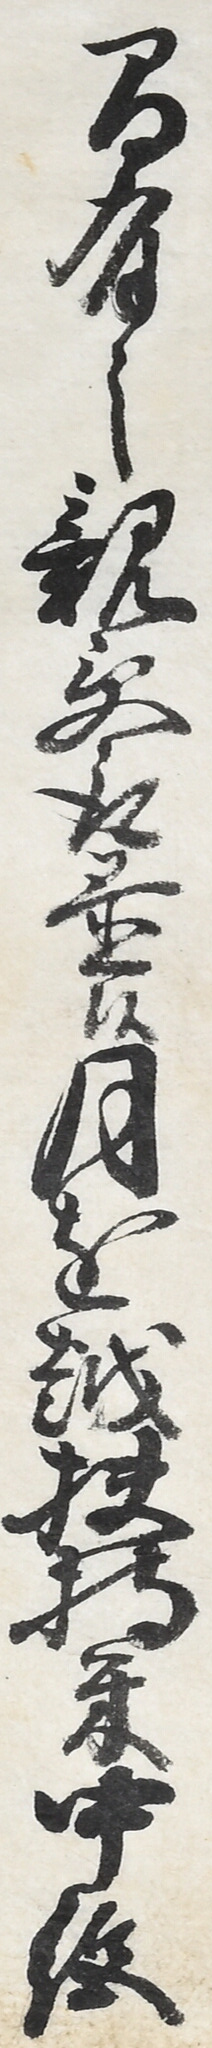間有之親受取置候月を越扶持米申儀
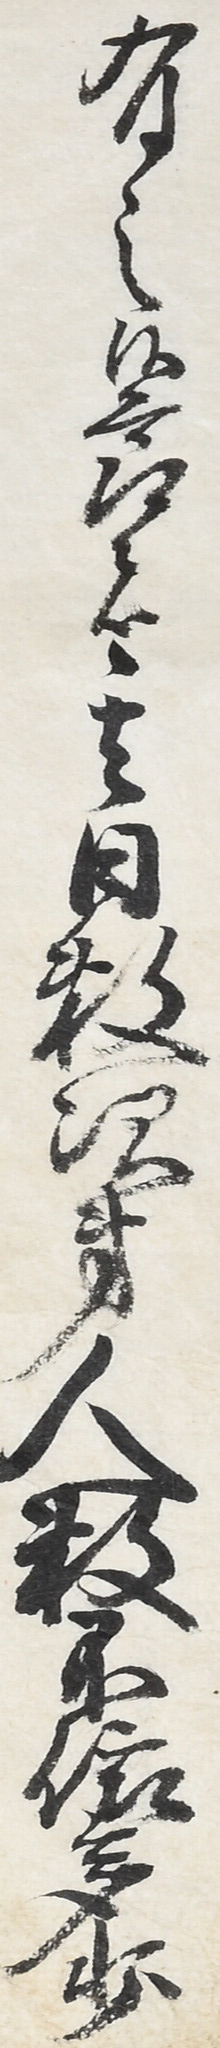有之候節は其日数次第人数不依多少
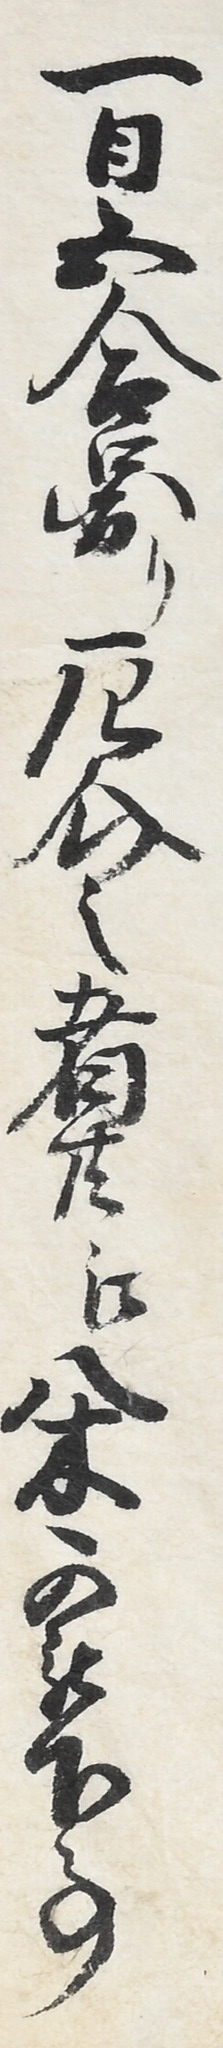一月五合図り厄介之者共江八木可被下事

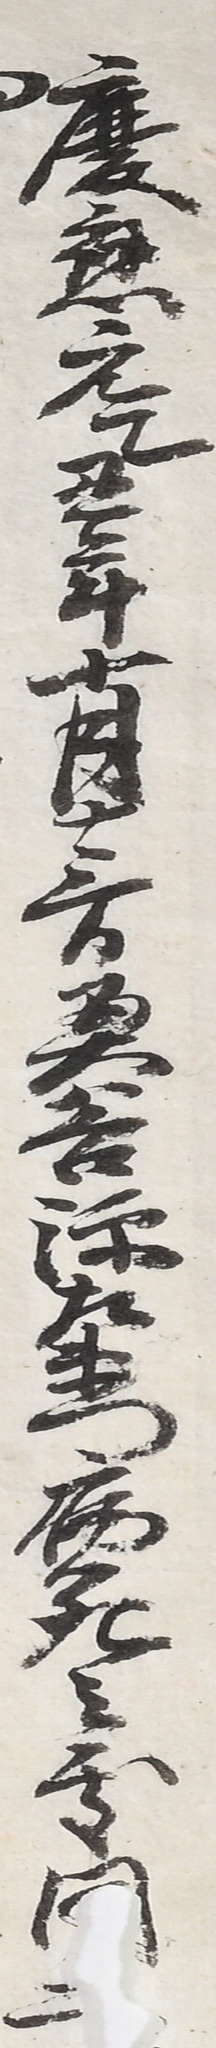「一慶応元乙丑年十月十三日魚谷源左衛門病死之処同二
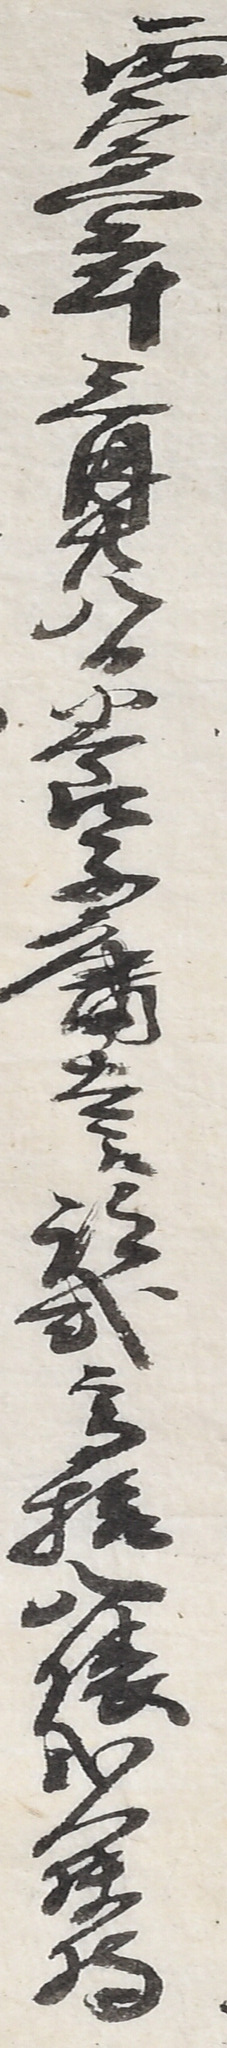丙寅年三月廿八日養子太江跡式高拾八俵弐人扶持
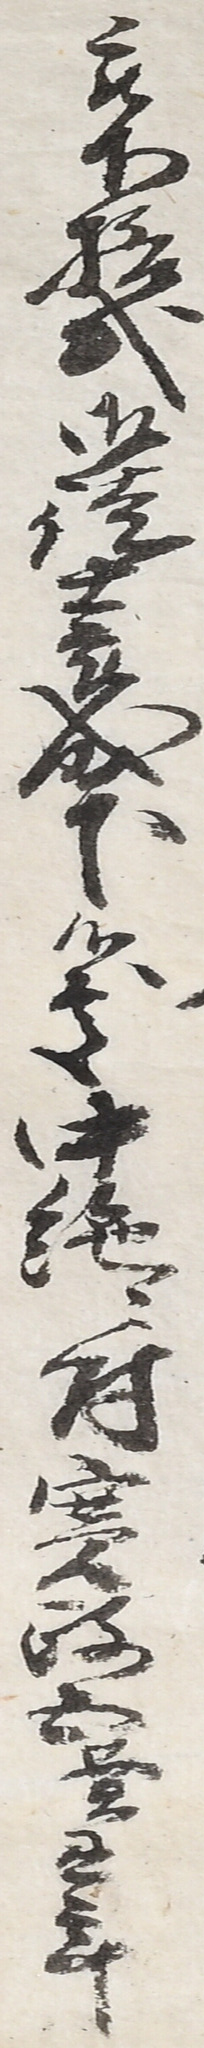被下格式御徒士被成下候処中絶ニ付寛政五癸丑年
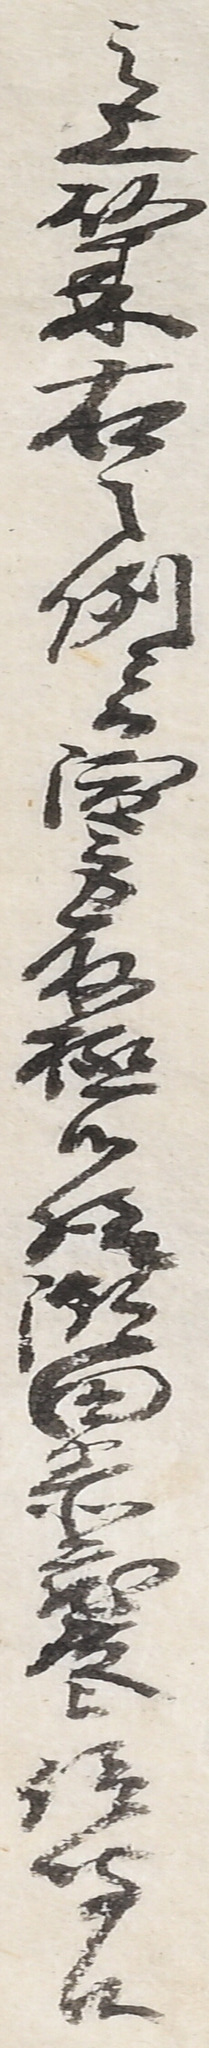之上以来右之例ニ而渡取極候様瀬田赤蔵殿被仰聞候
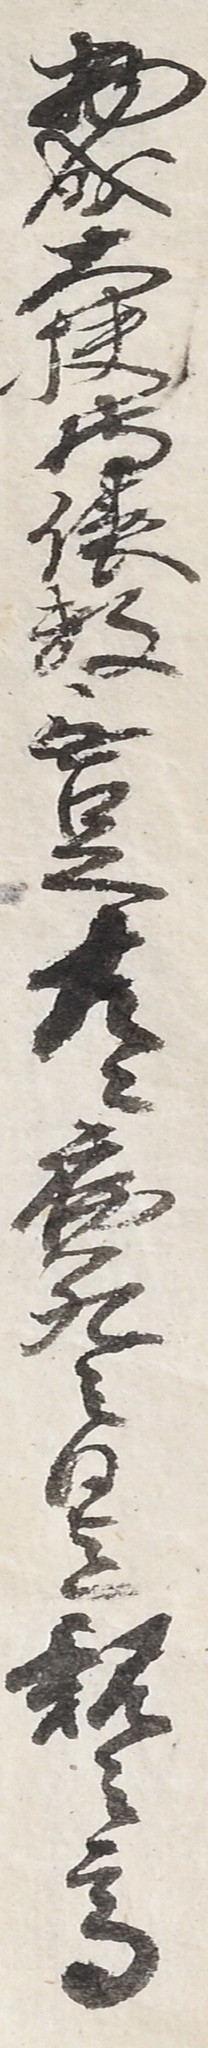物成大扶持俵数無足共ニ病死之日迄親之高
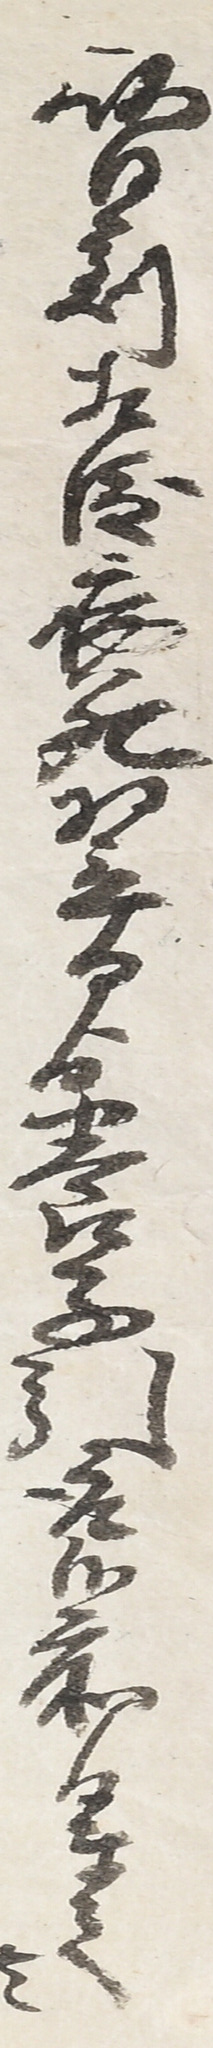以日割相渡病死翌日ゟ養子引取候前日まては
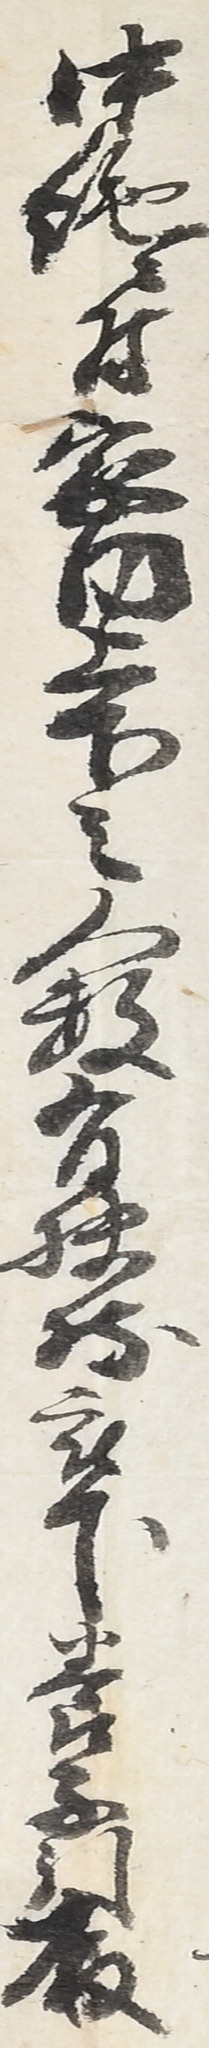中絶ニ付家内上下之人数有扶持被下養子引取
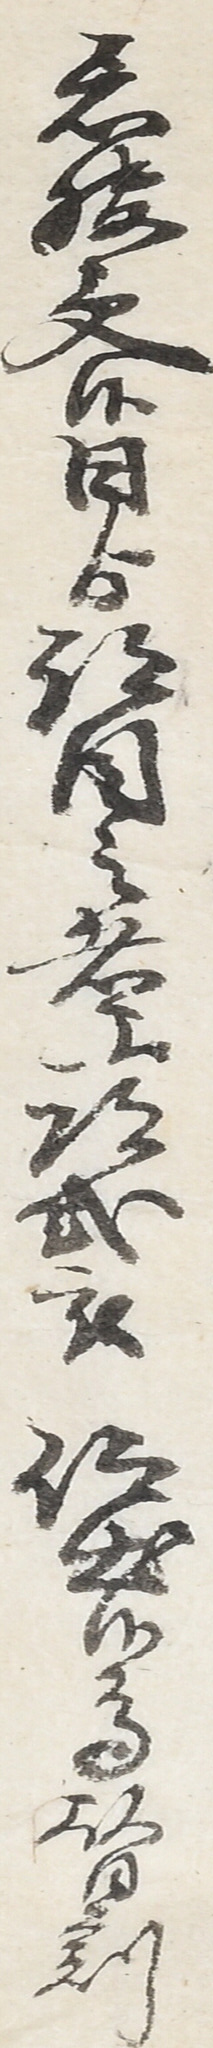着服受候日ゟ跡目之者江跡式被仰出候高以日割
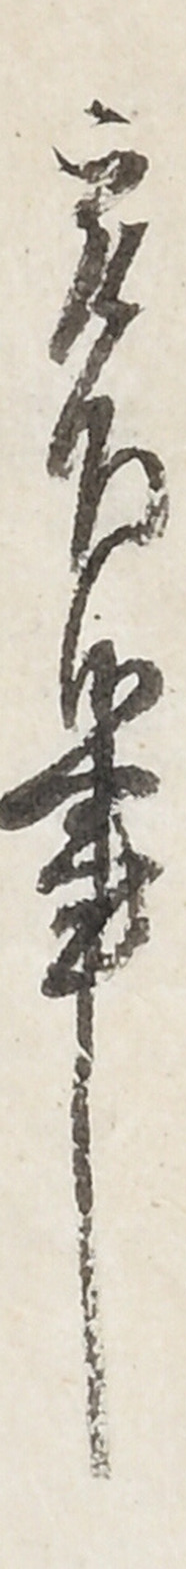被下候事
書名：御給分渡方之定
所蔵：伊那市立高遠町図書館・合同会社AMANE
